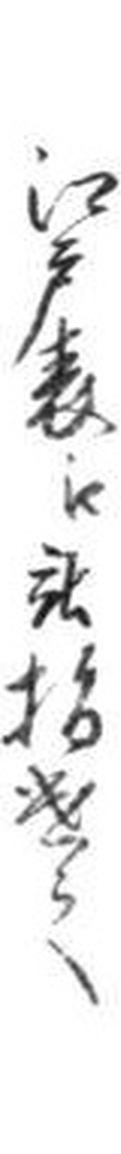江戸表江被指遣之
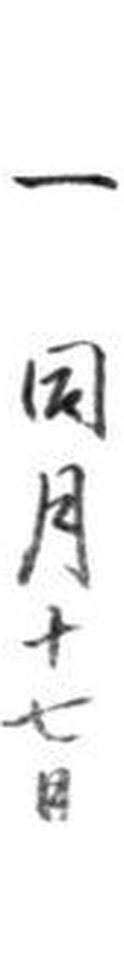一同月十七日
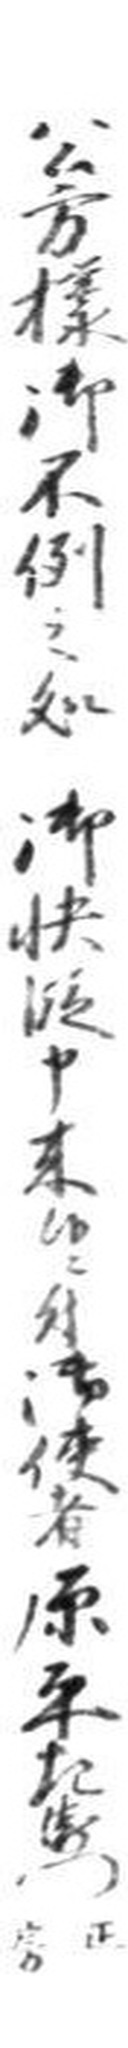公方様御不例之処御快段申来候ニ付御使者原平左衛門正
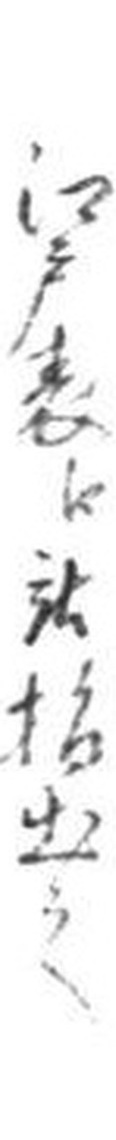江戸表江被指出之
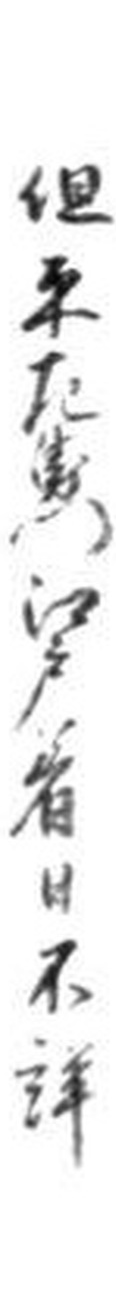但平左衛門江戸着日不詳
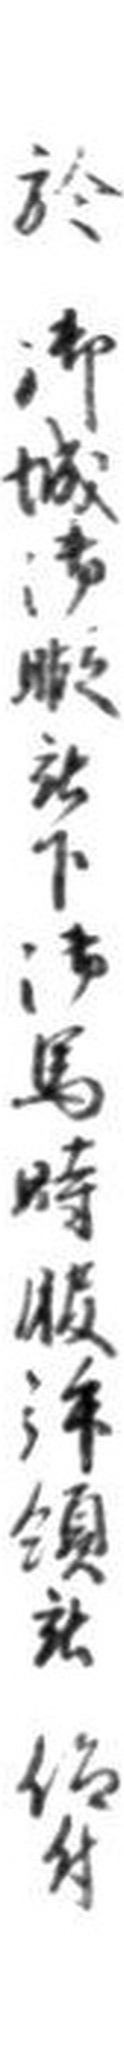於御城御暇被下御馬時服拝領被仰付
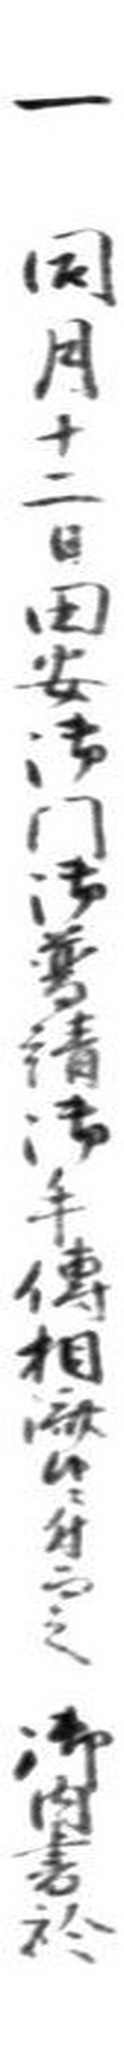一同月十二日田安御門御普請御手伝相済候ニ付而之御内書於
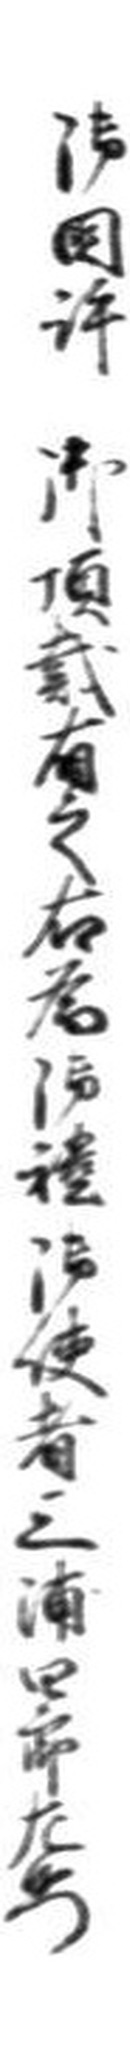御国許御頂戴有之右為御礼御使者三浦四郎左衛門
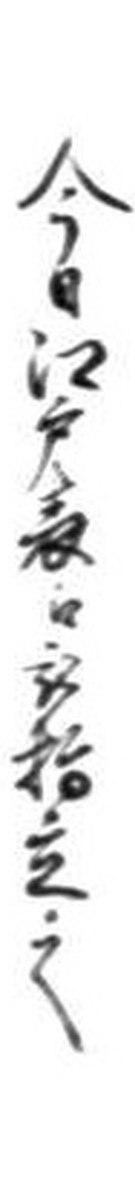今日江戸表江被指立之
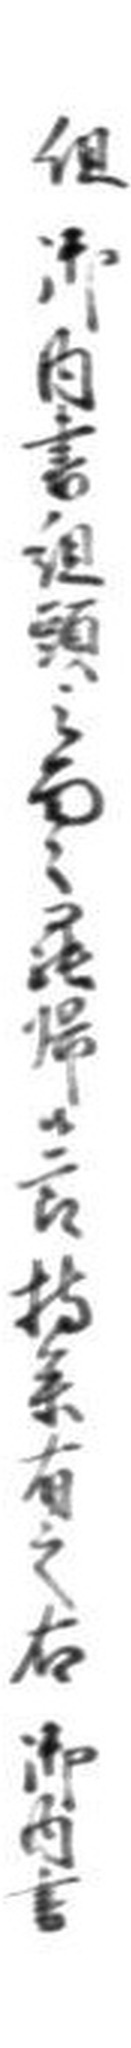但御内書組頭之面々罷帰候節持参有之右御内書
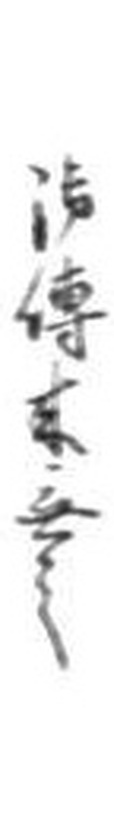御伝来無之
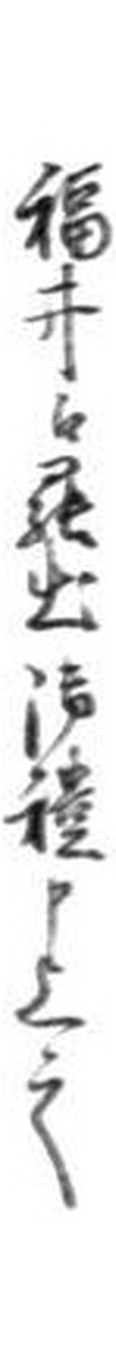福井江罷出御礼申上之
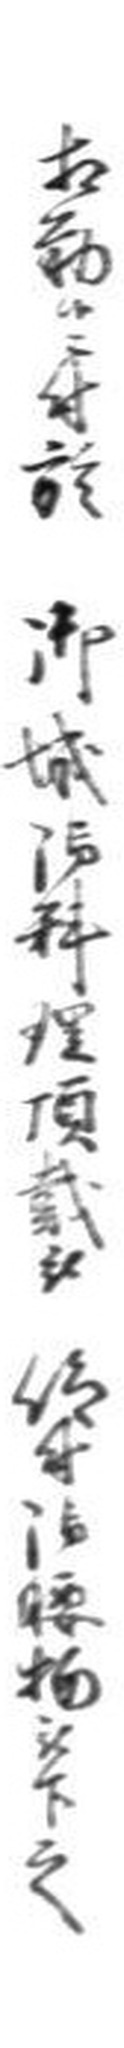相勤候ニ付於御城御料理頂戴被仰付御腰物被下之
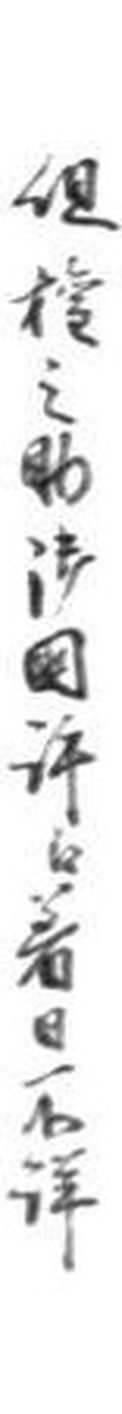但権之助御国許江着日不詳

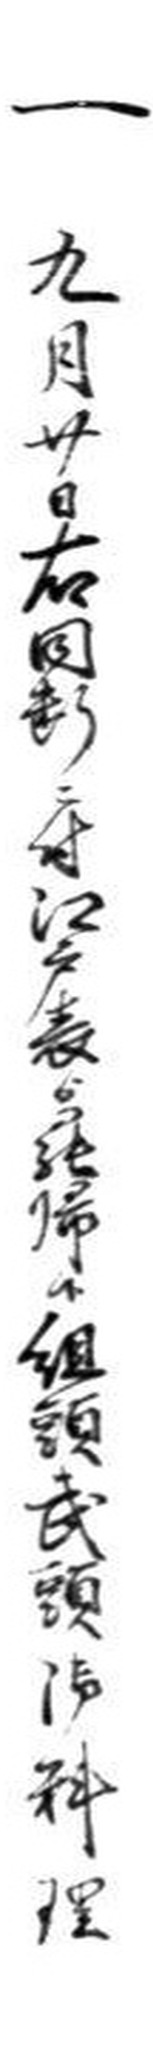一九月廿日右同断ニ付江戸表ゟ罷帰候組頭武頭御料理
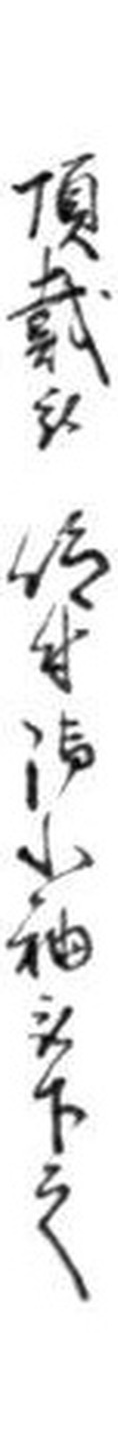頂戴被仰付御小袖被下之
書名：家譜 三 忠昌公 従慶長八年到寛永六年
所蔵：福井県文書館 Fukui Prefectural Archives
